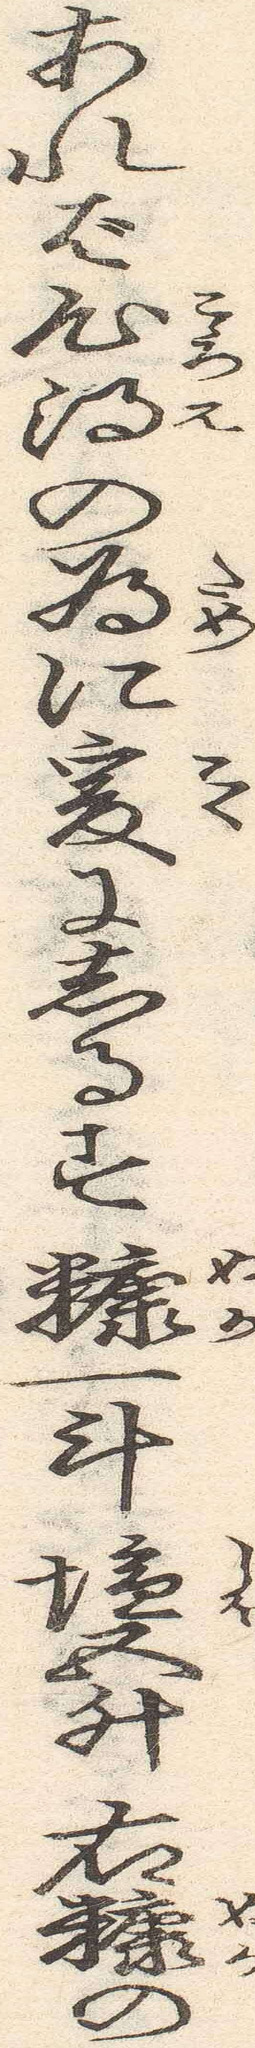あれば心得の為に爰にしるす糠一斗塩五升右糠の
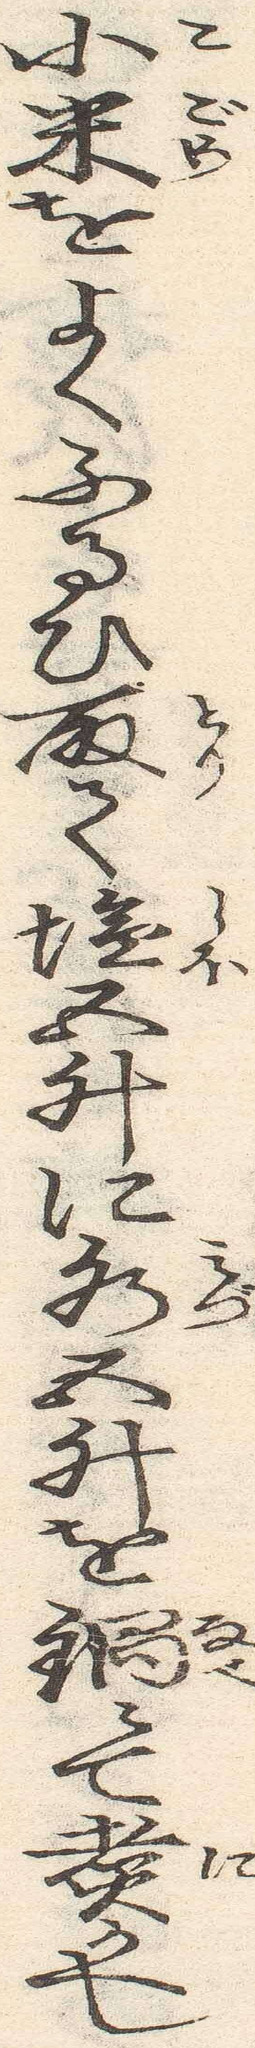小米をよくふるひ取て塩五升に水五升を鍋にて煮かへし
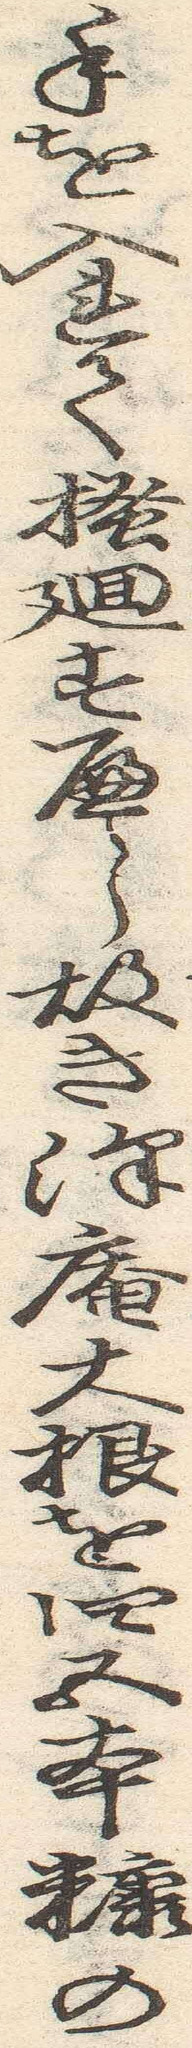手を入れて掻廻すへし故き沢庵大根を四五本糠の
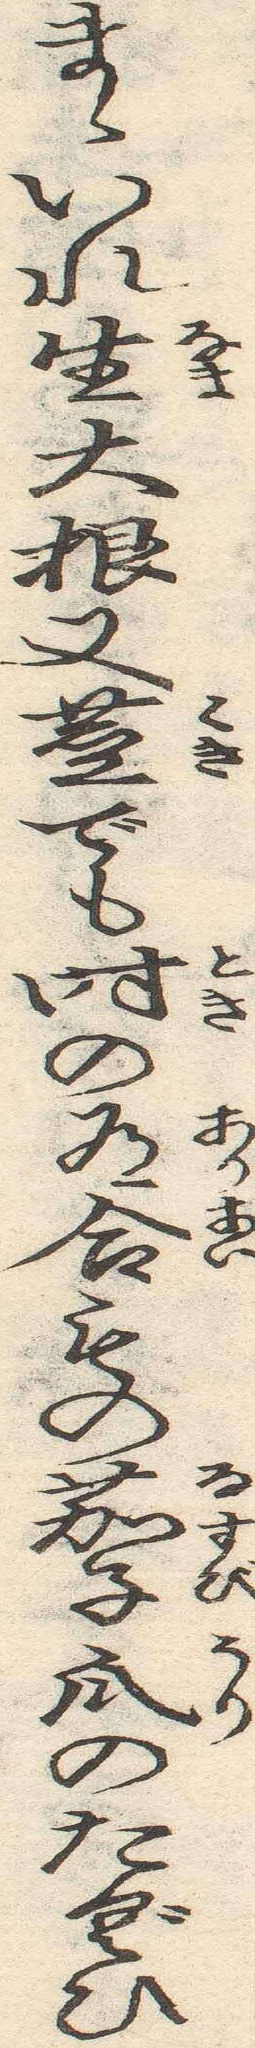まゝいれ生大根又茎でも時の有合もの茄子瓜のたぐひ
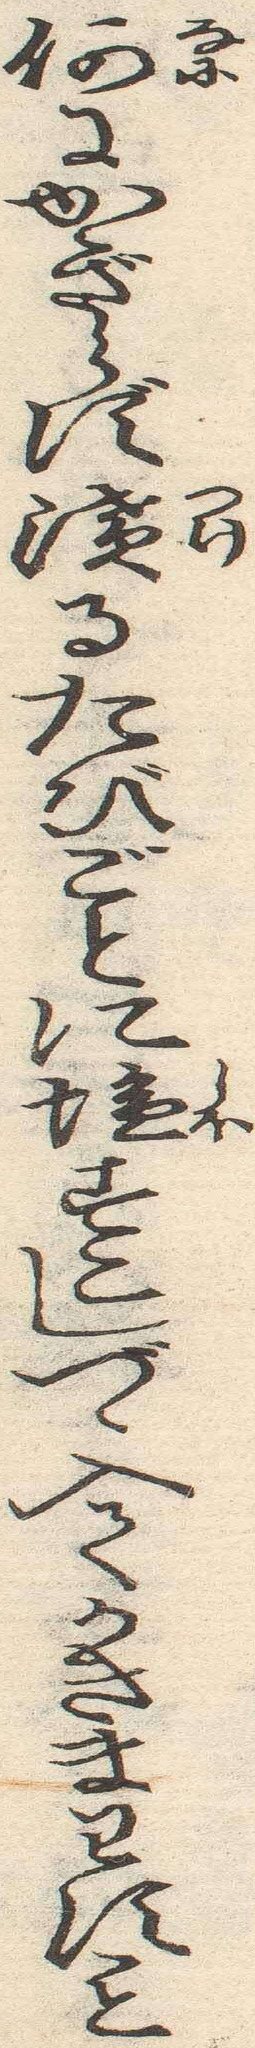何にかぎらず漬るたびごとに塩すこしづゝ入てかきまわすこと

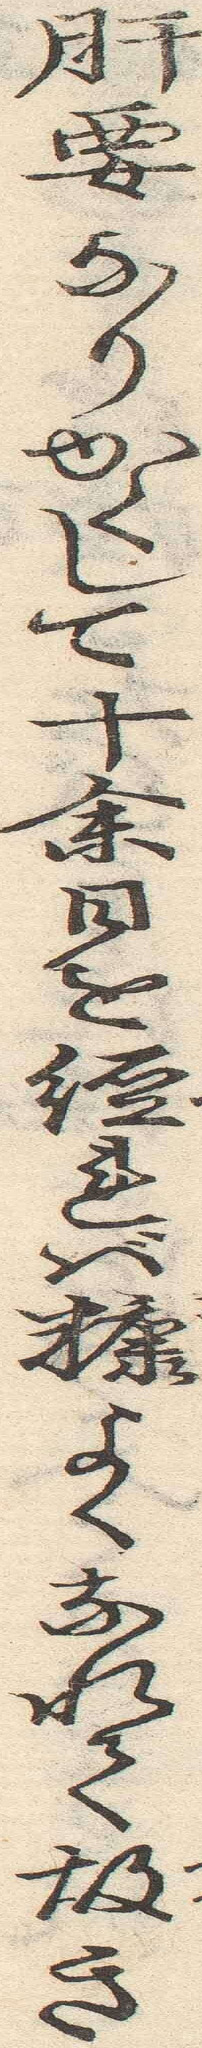肝要なりかくして十余日を経れば糠よくなれて故き
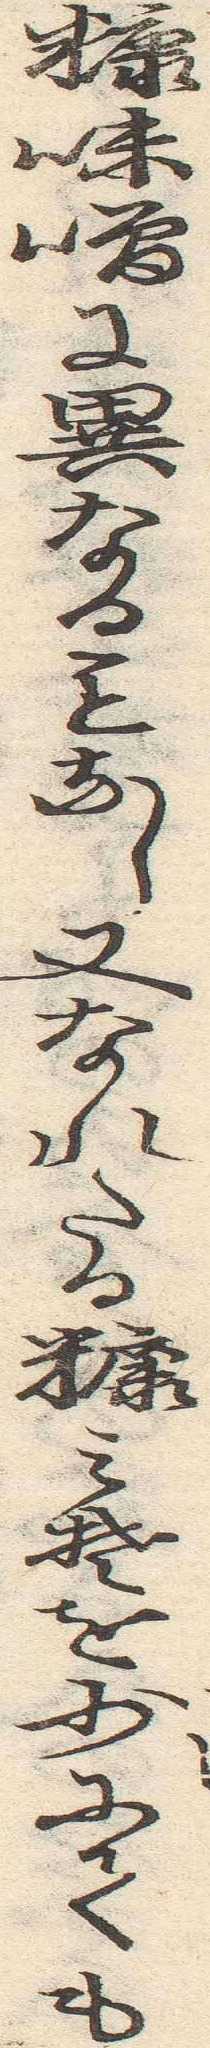糠味噌に異なることなし又なれたる糠みそを少にても
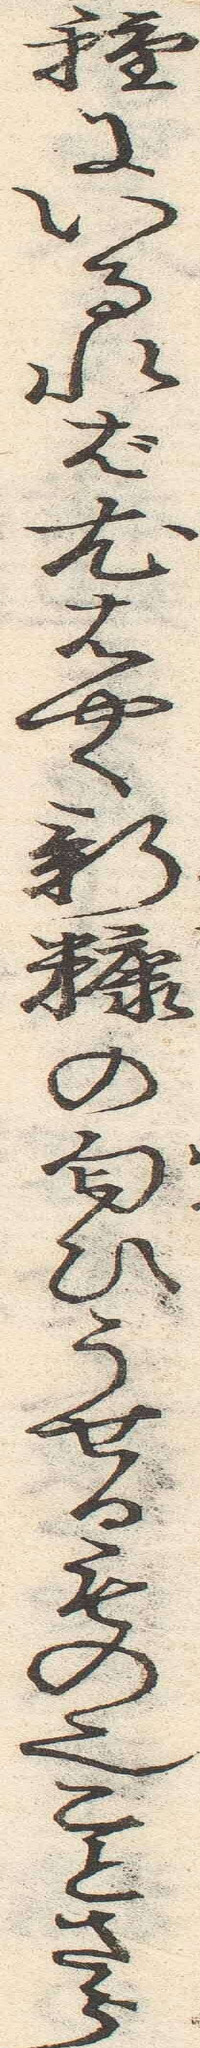種にいるれば尤もはやく新糠の匂ひうせるもの也ことさら
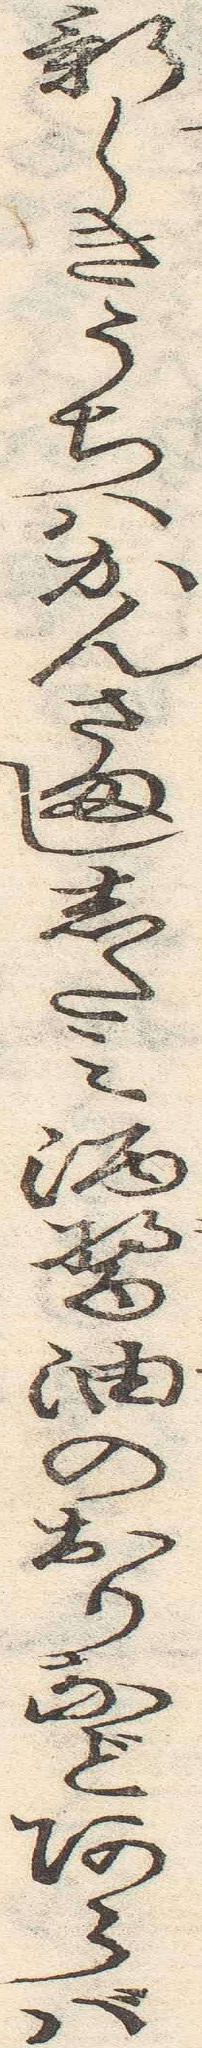新しきうちはかんさまししたみ酒醤油のおりなどあらば
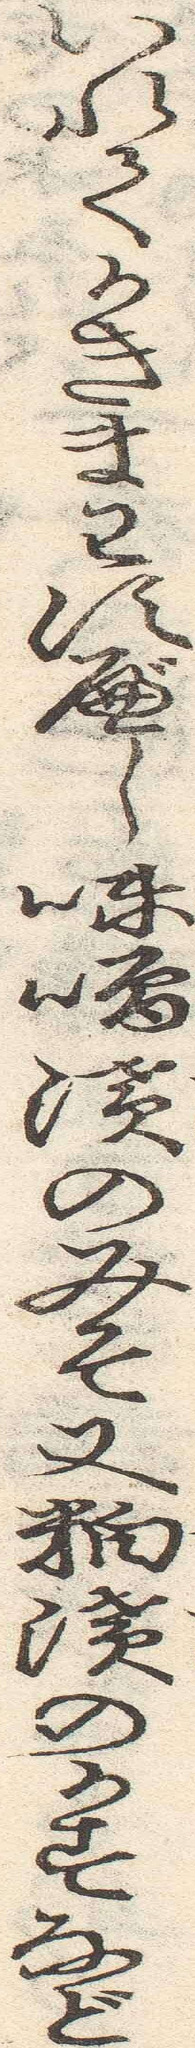いれてかきまわすべし味噌漬のみそ又粕漬のかすなど
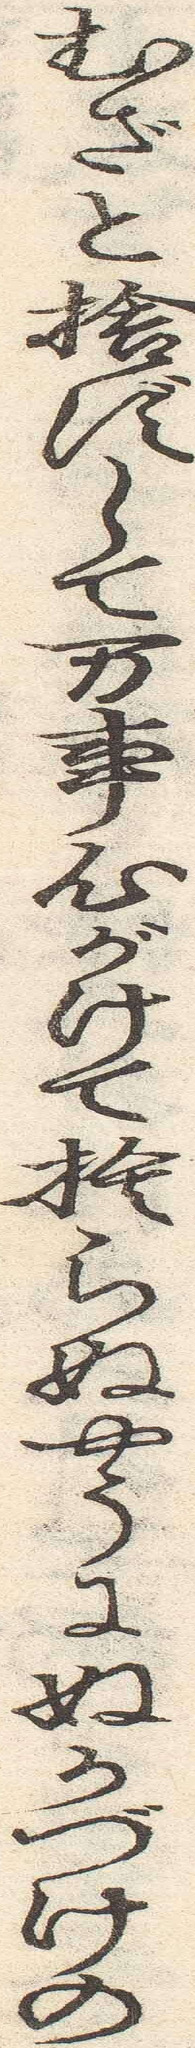むざと捨ずして万事心がけて捨らぬやうにぬかづけの
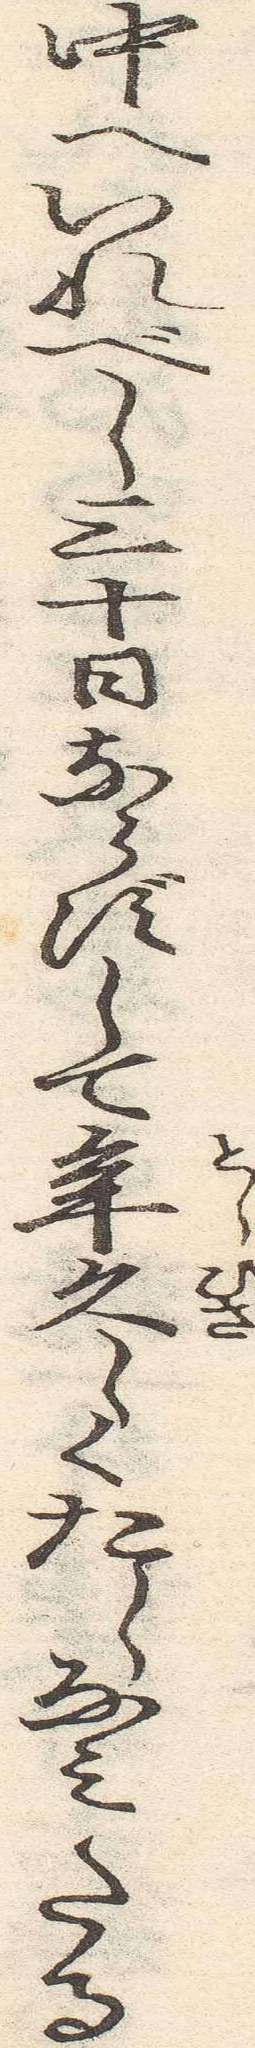中へいれべし三十日ならずして年久しくたしなみたる
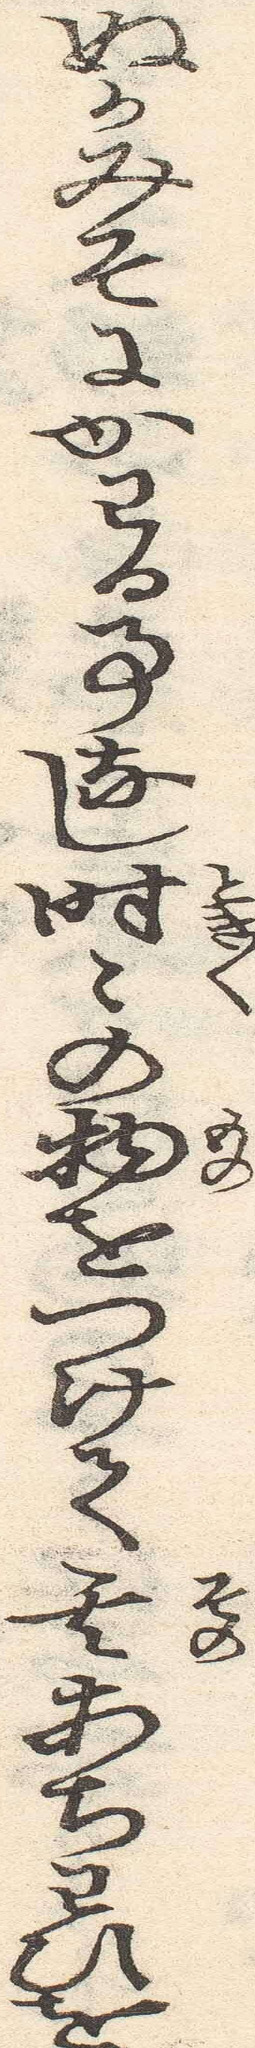ぬかみそにかわる事なし時々の物をつけて其あちわひを
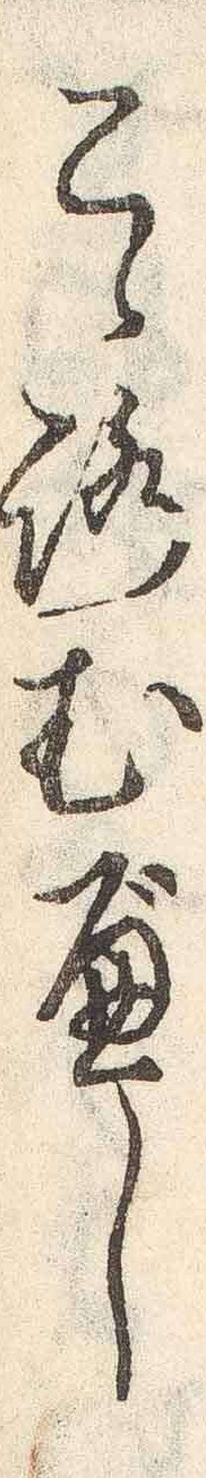こゝろむべし
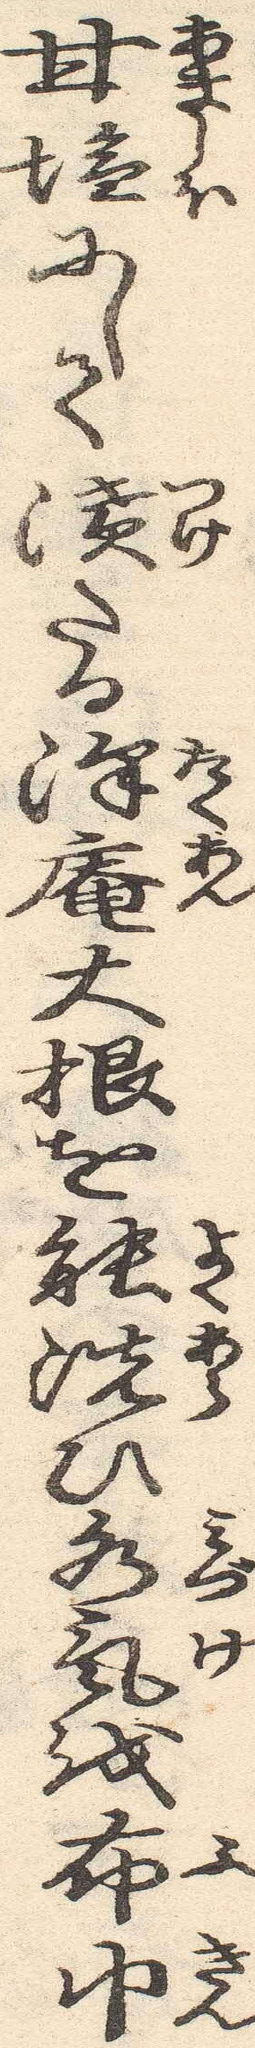甘塩にして漬たる沢庵大根を能洗ひ水気を布巾
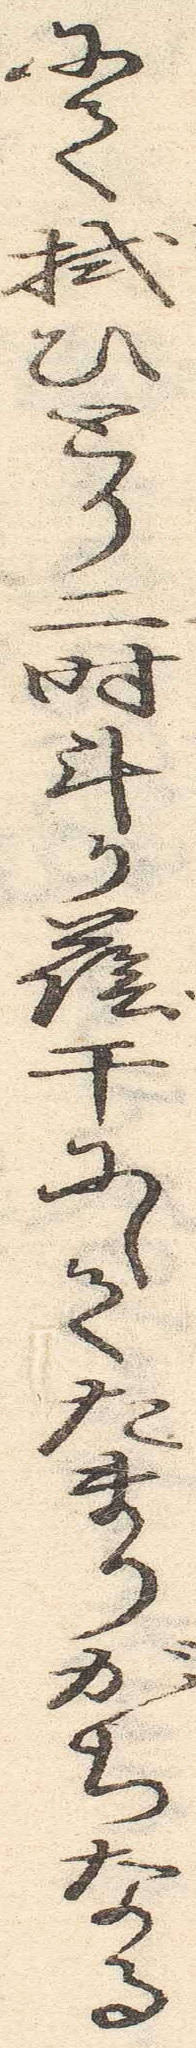にて拭ひとり二時斗り陰干にしてたまりがちなる
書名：四季漬物塩嘉言
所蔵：東京学芸大学附属図書館 国文学研究資料館
